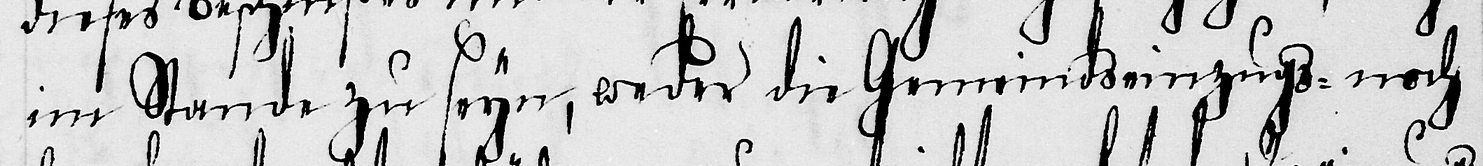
im Stande zu seyn, weder die Gemeindseinzugs- noch
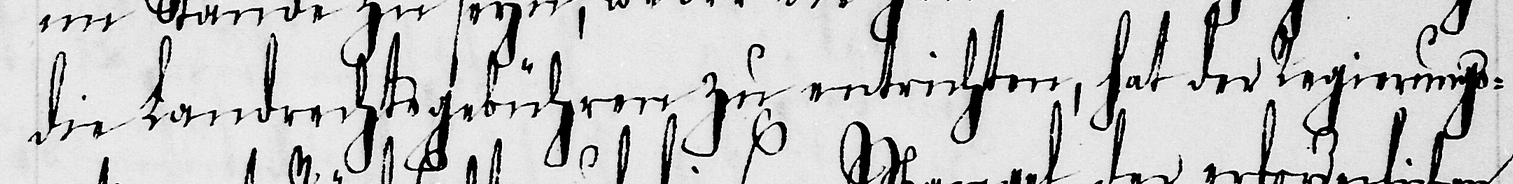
die Landrechtsgebühren zu entrichten, hat der Regierungs¬
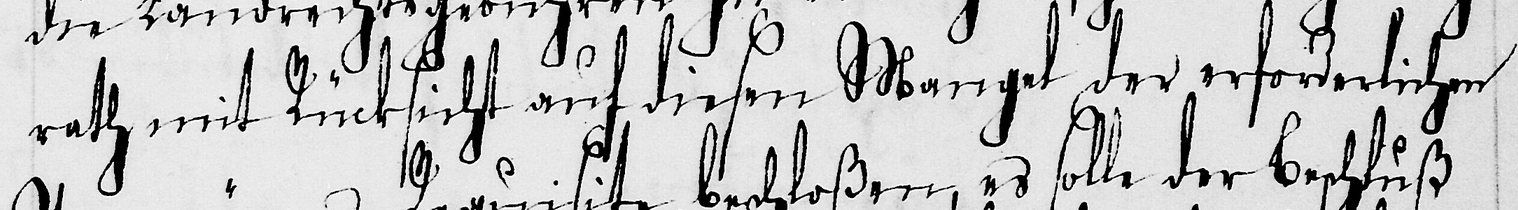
rath mit Rücksicht auf diesen Mangel der erforderlichen
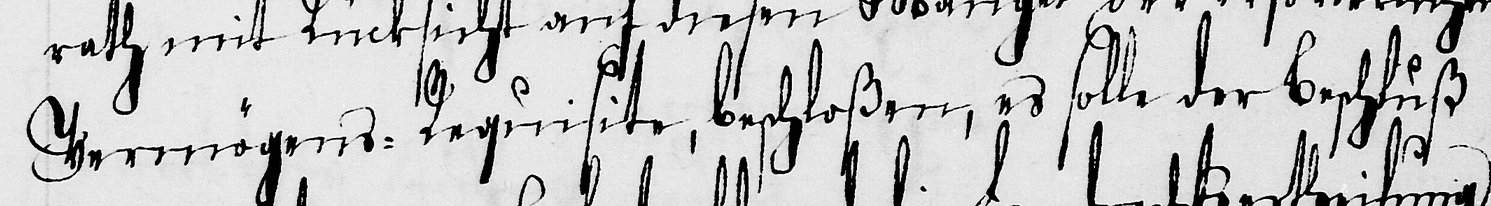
Vermögens-Requisite, beschloßen, es solle der Beschluß
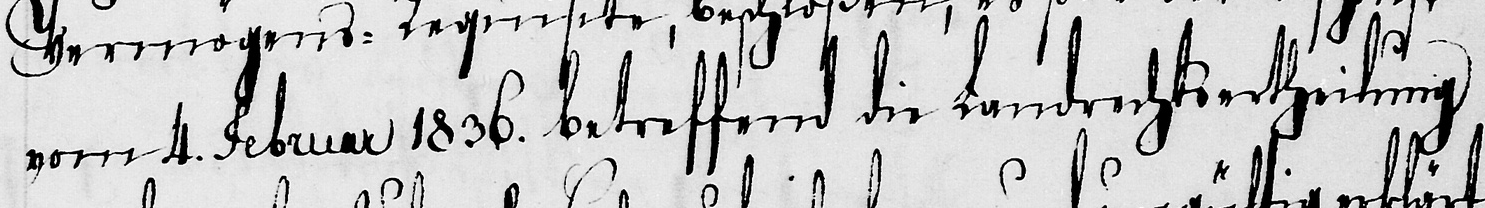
vom 4. Februar 1836. betreffend die Landrechtsertheilung
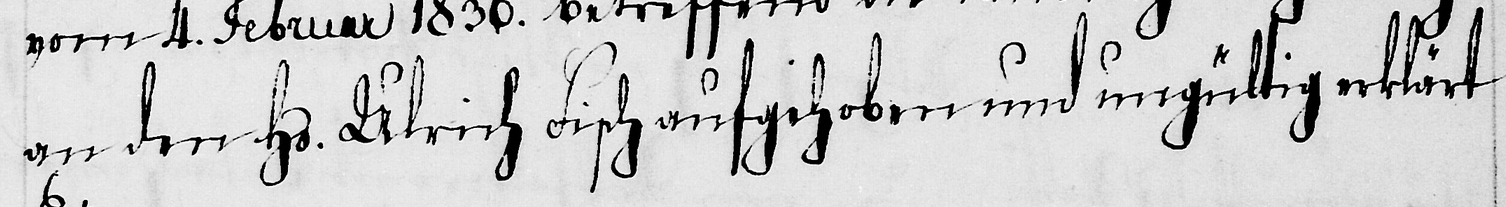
an den Hs. Ulrich Fisch aufgehoben und ungültig erklärt
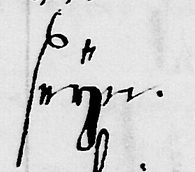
seyn.
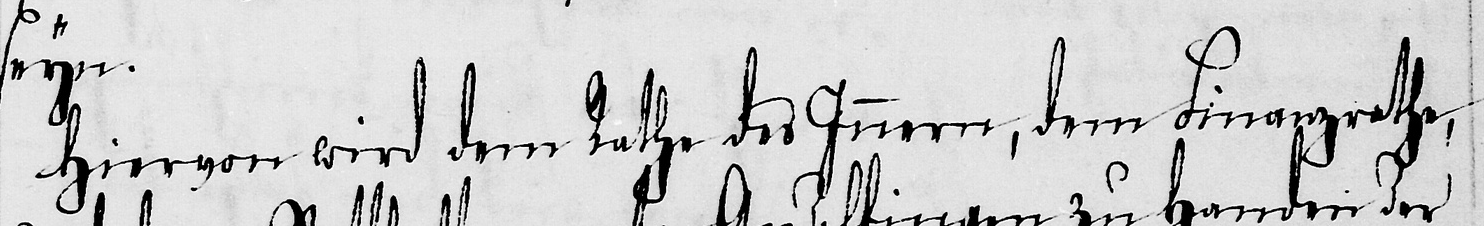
Hiervon wird dem Rathe des Innern, dem Finanzrathe,
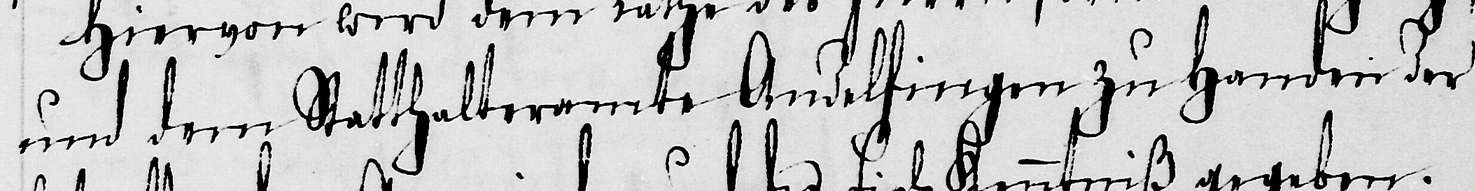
und dem Statthalteramte Andelfingen zu Handen der
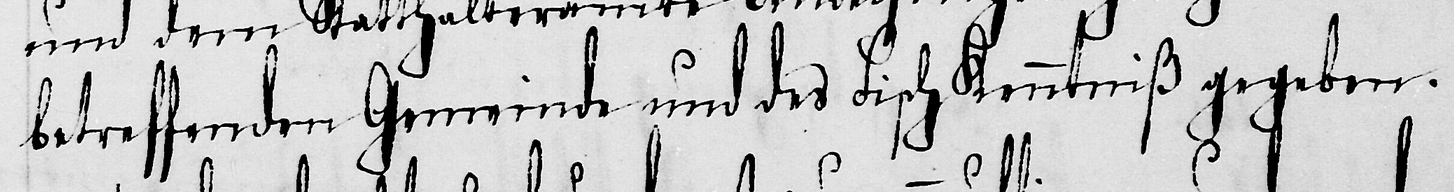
betreffenden Gemeinde und des Fisch Kenntniß gegeben.
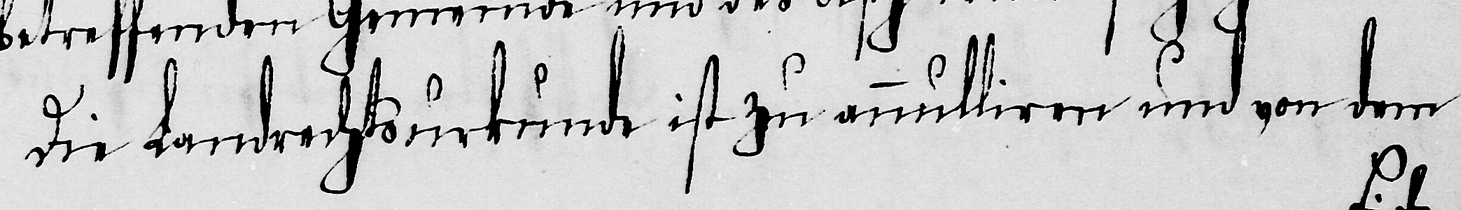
Die Landrechtsurkunde ist zu annulliren und von dem
